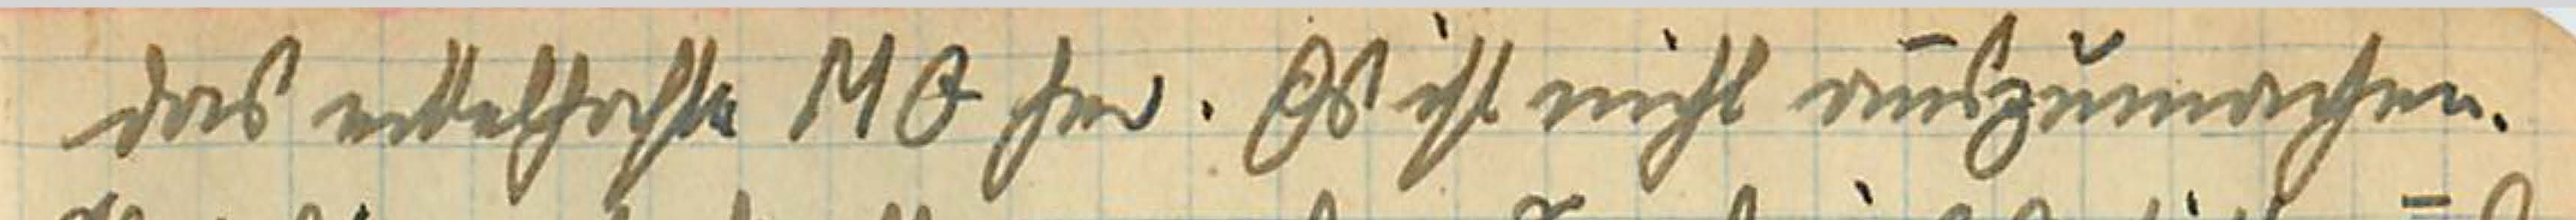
das ekelhafte MG her. Es ist nicht auszumachen.
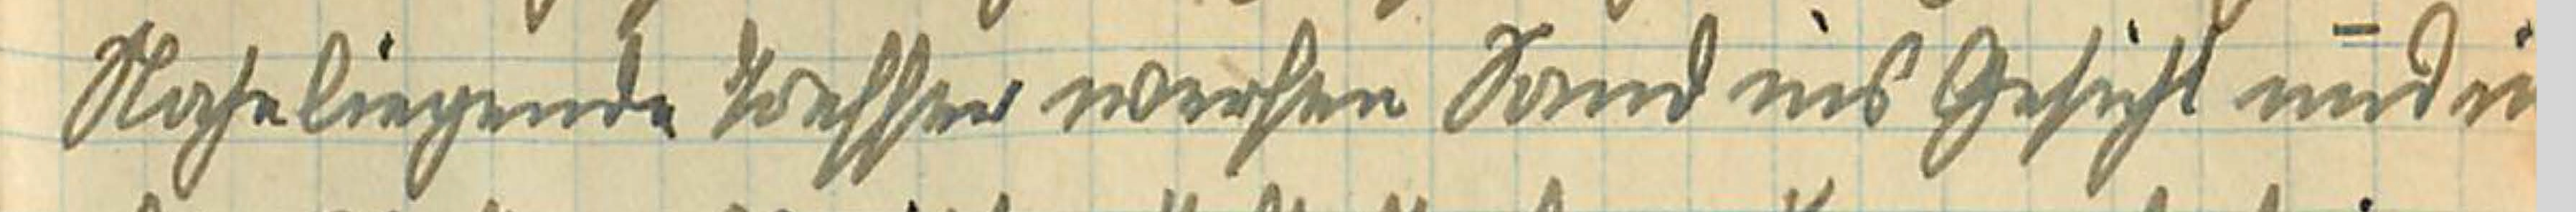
Naheliegende Treffer werfen Sand ins Gesicht und in
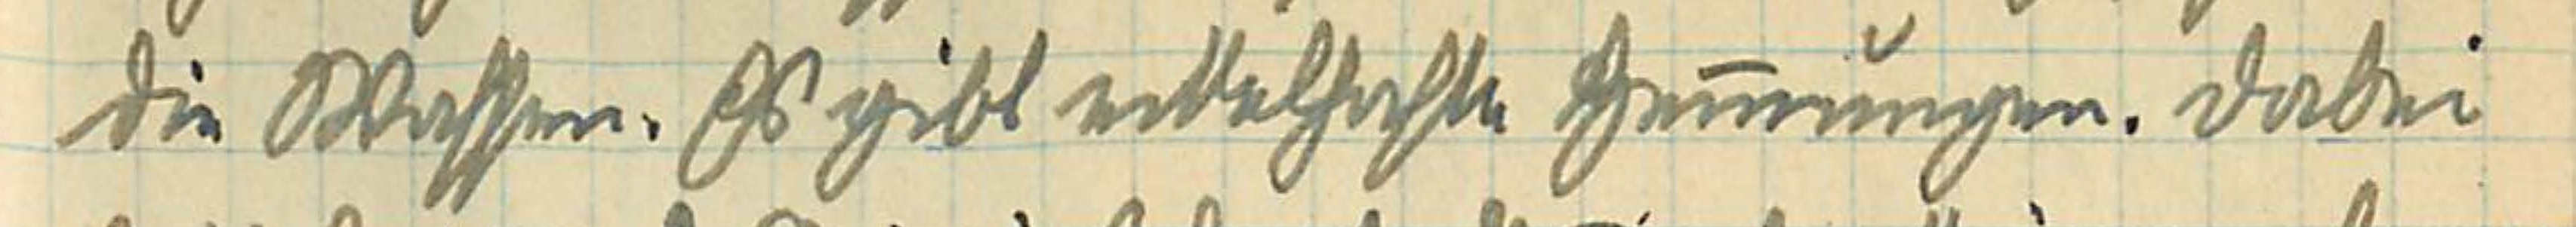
die Waffen. Es gibt ekelhafte Hemmungen. Dabei
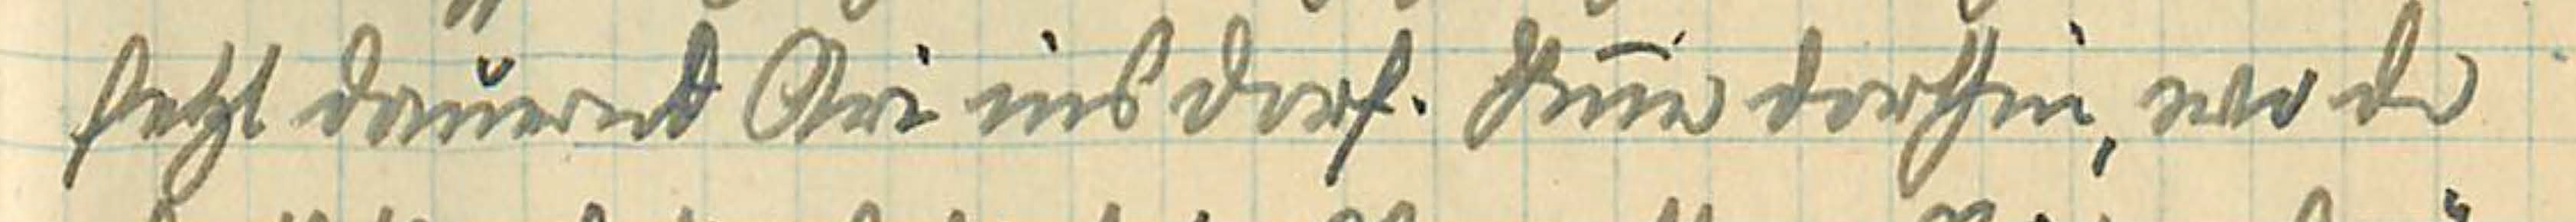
fetzt dauernd Ari ins Dorf. Immer dorthin, wo der
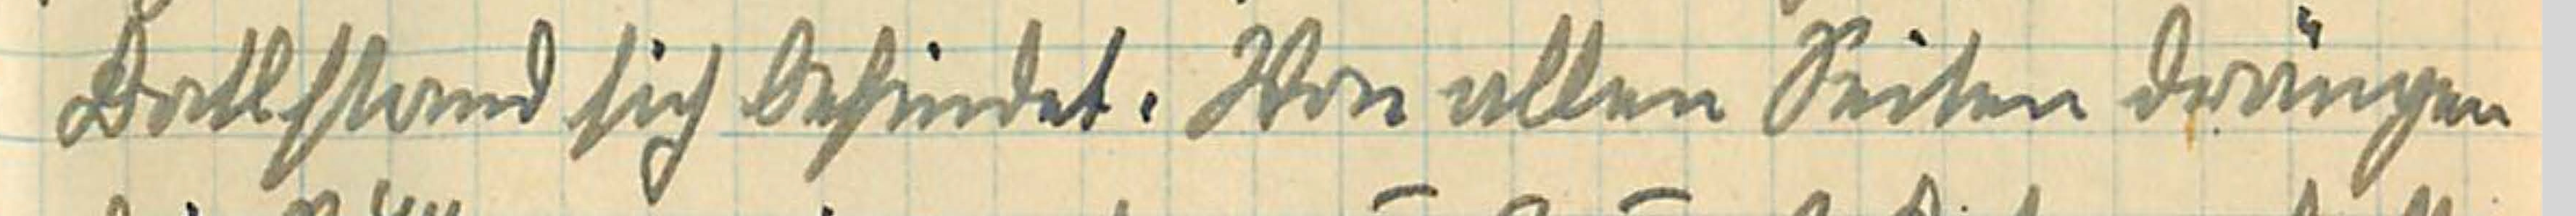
Batl.stand sich befindet. Von allen Seiten drängen
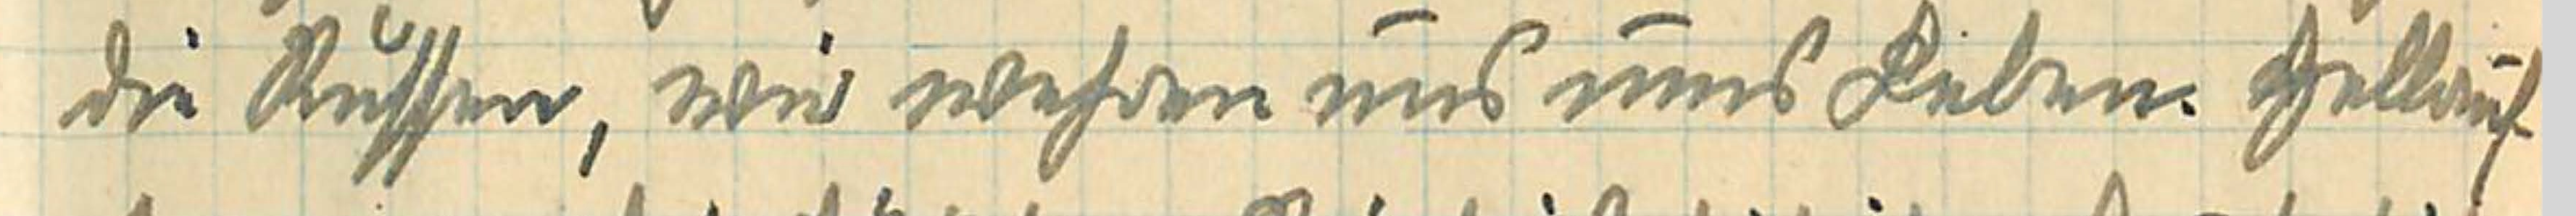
die Russen, wir wehren uns ums Leben. Hellauf
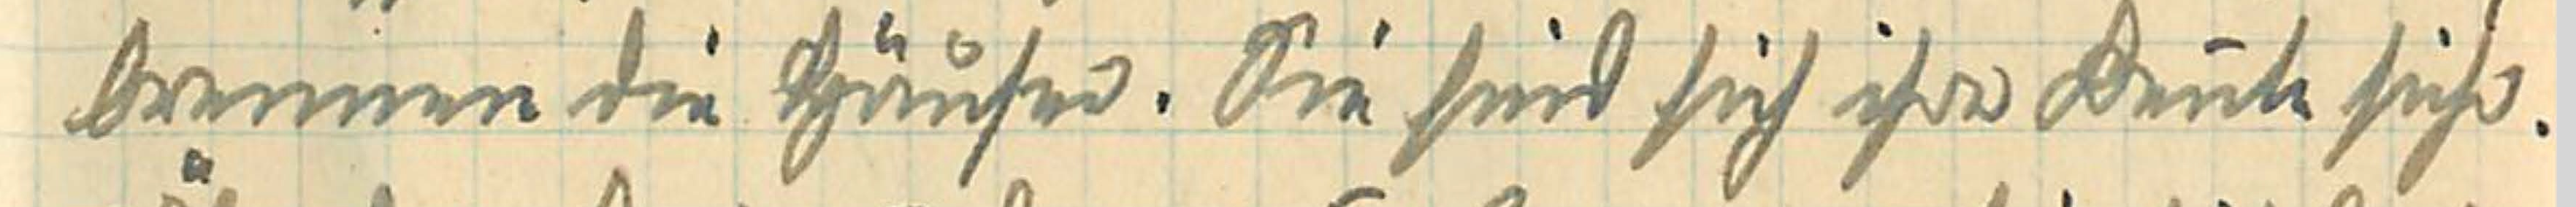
brennen die Häuser. Sie sind sich ihrer Beute sicher.
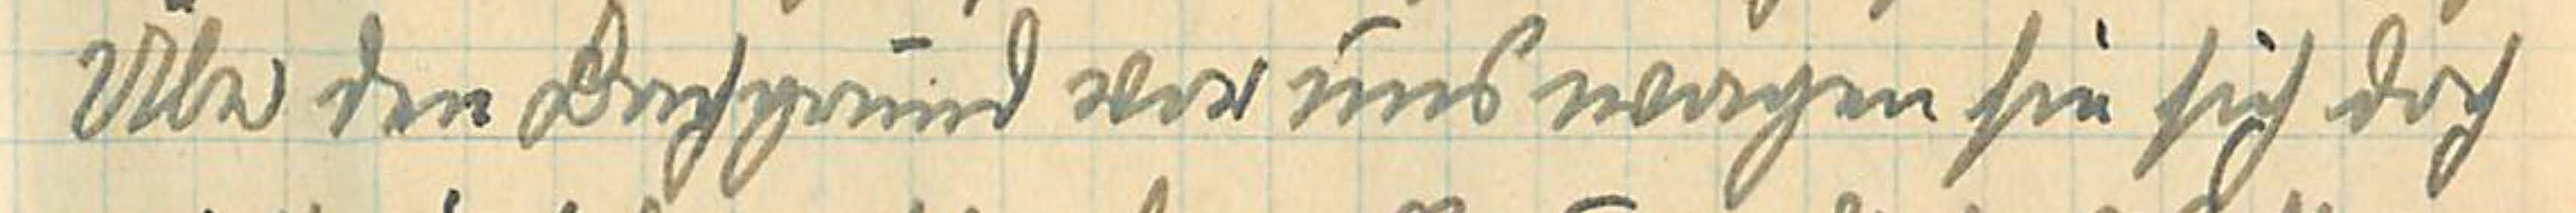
Über den Bachgrund vor uns wagen sie sich doch
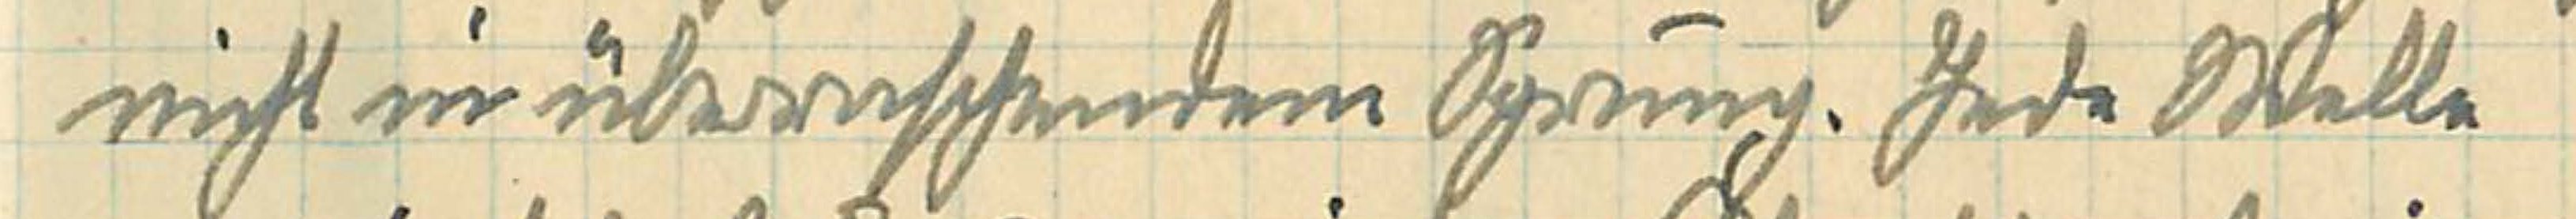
nicht in überraschendem Sprung. Jede Welle
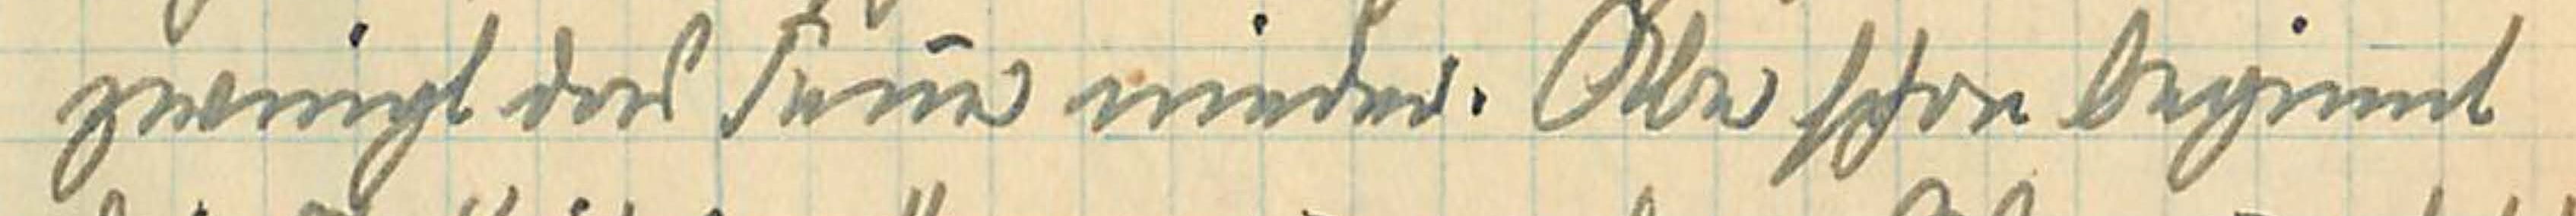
zwingt das Feuer nieder. Aber schon beginnt
